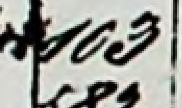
103
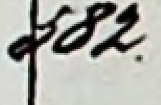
582
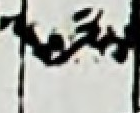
???
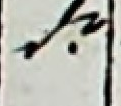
Do
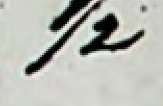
1/2
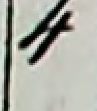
4
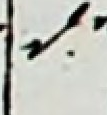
Do
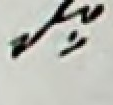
Do
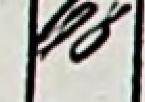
68
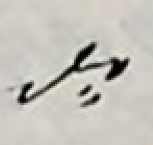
Do
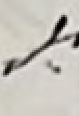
Do
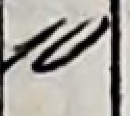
10
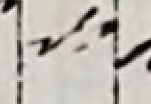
Do
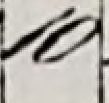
10
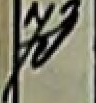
73
